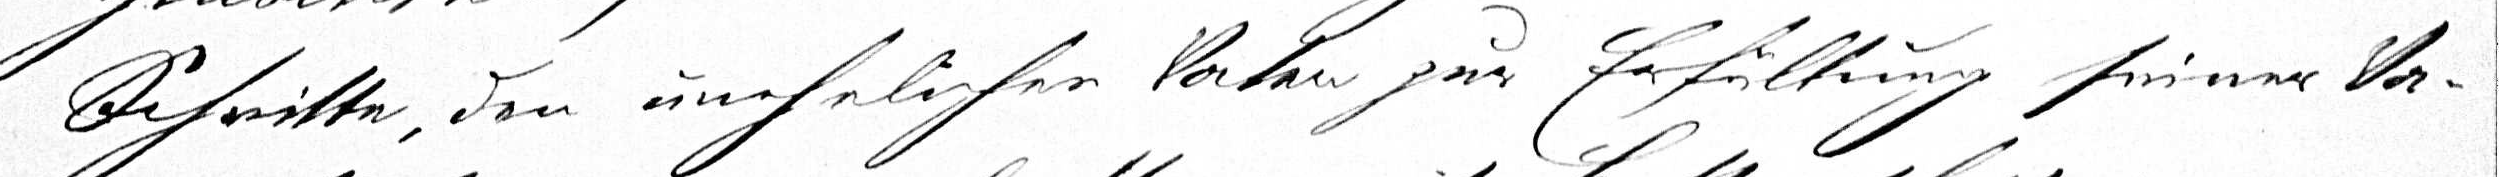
Schritte, den unehelichen Vater zur Erfüllung seiner Va¬
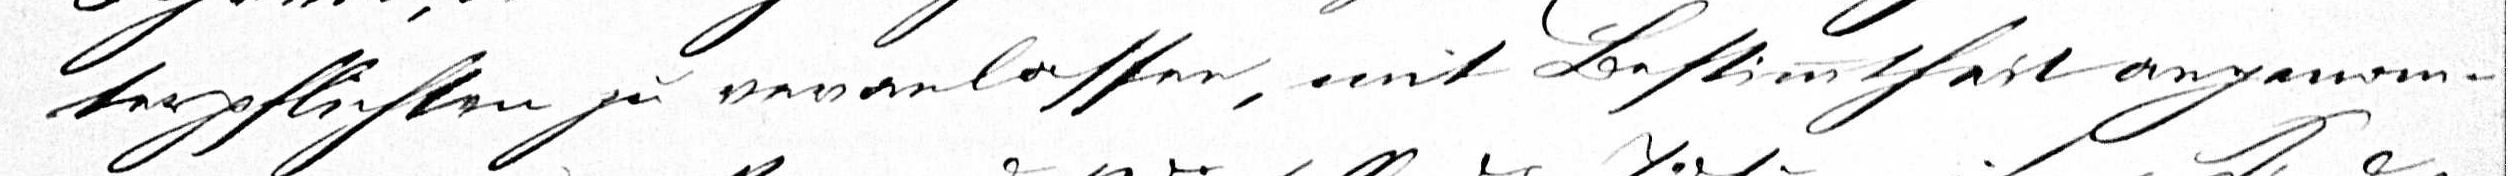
terpflichten zu veranlassen, mit Bestimmtheit angenom¬
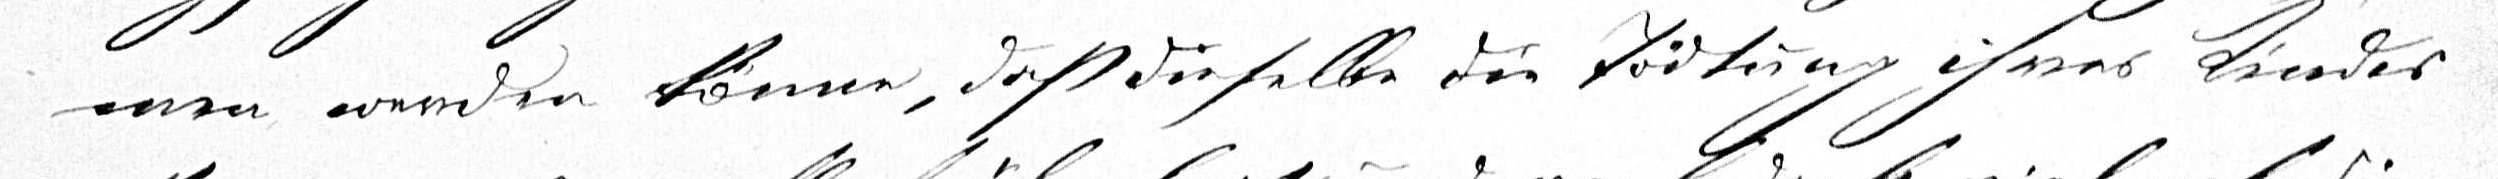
men werden könne, daß dieselbe die Tödtung ihres Kindes
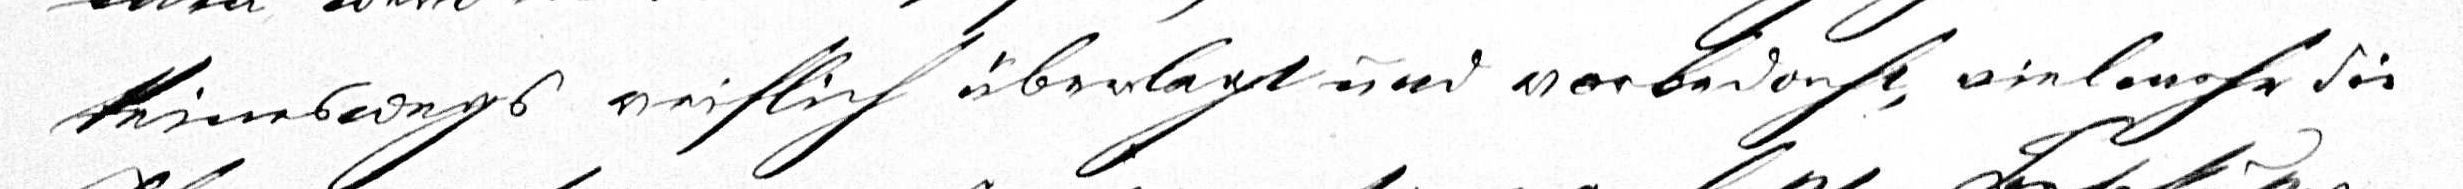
keineswegs reiflich überlegt und vorbedacht, vielmehr die
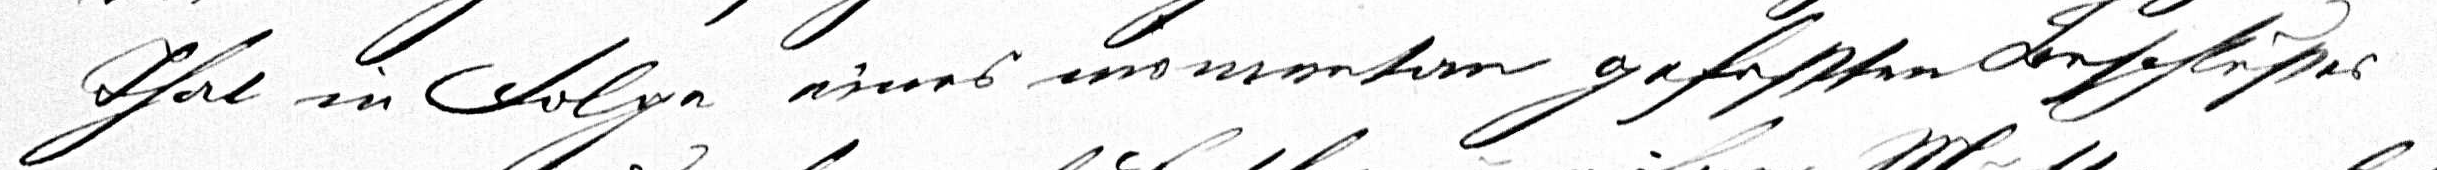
That in Folge eines momentan gefaßten Beschlußes
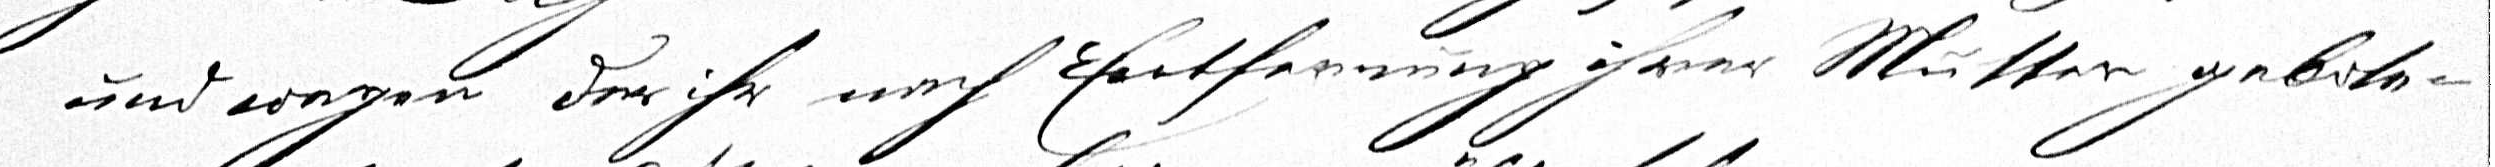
und wegen der ihr nach Entfernung ihrer Mutter gebote¬
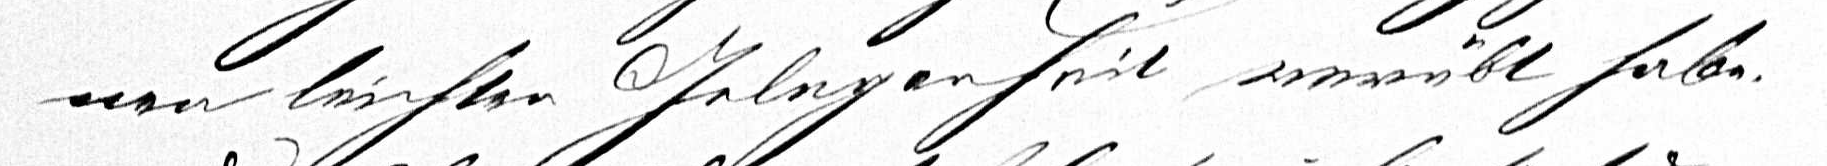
nen leichter Gelegenheit verübt habe.
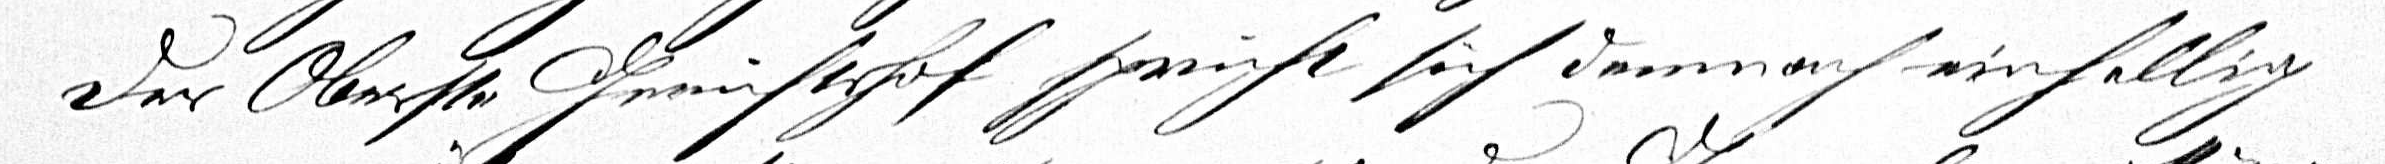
Der Oberste Gerichtshof spricht sich demnach einhellig
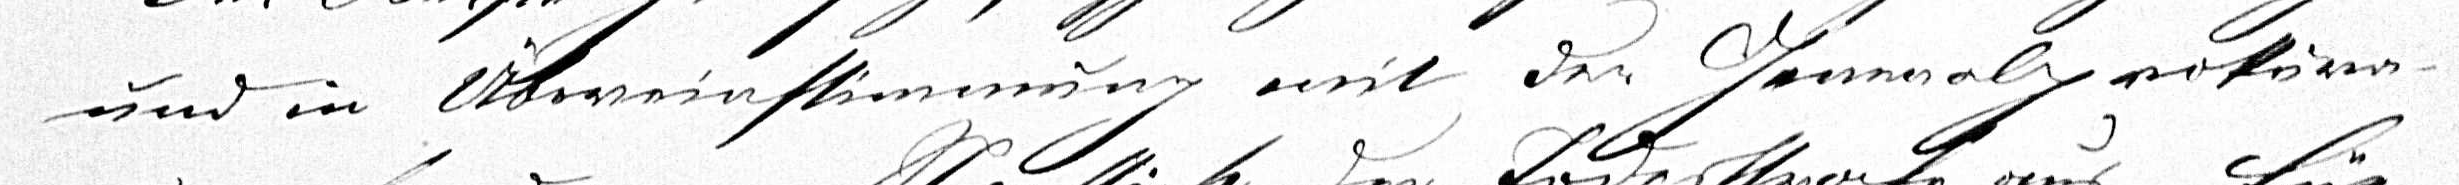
und in Überreinstimmung mit der Generalprokura¬
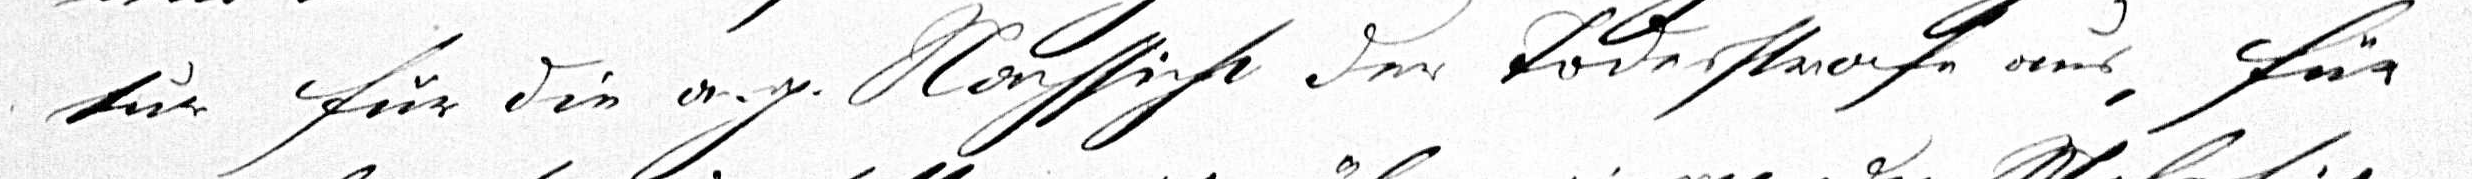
tur für die a. g. Nachsicht der Todesstrafe aus, für
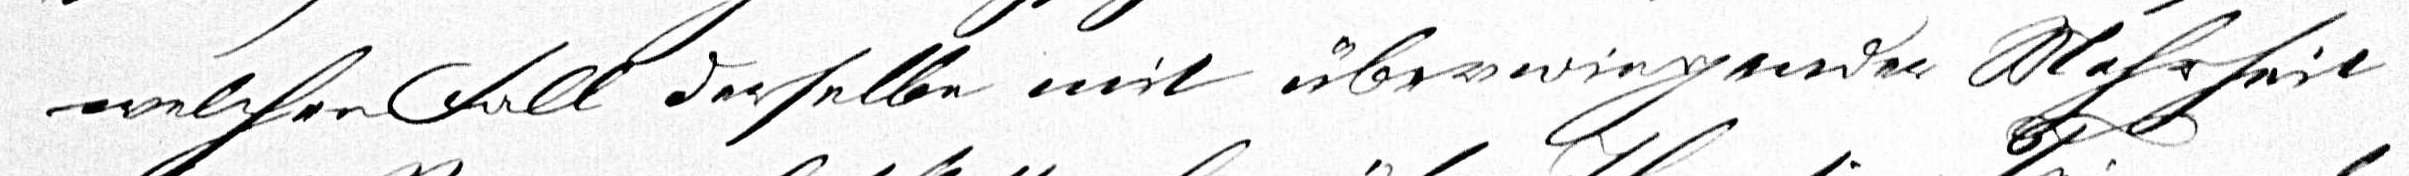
welchen Fall derselbe mit überwiegender Mehrheit
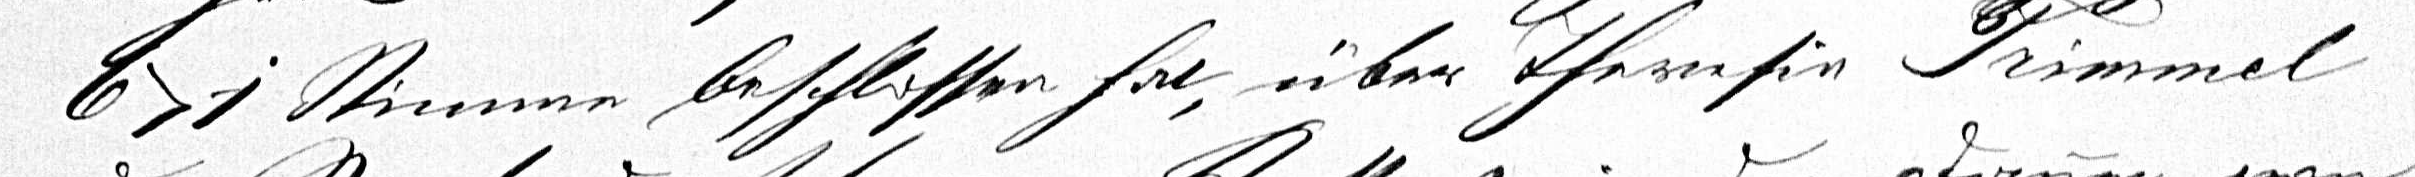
6>1 Stimme beschlossen hat, über Theresia Trimmel
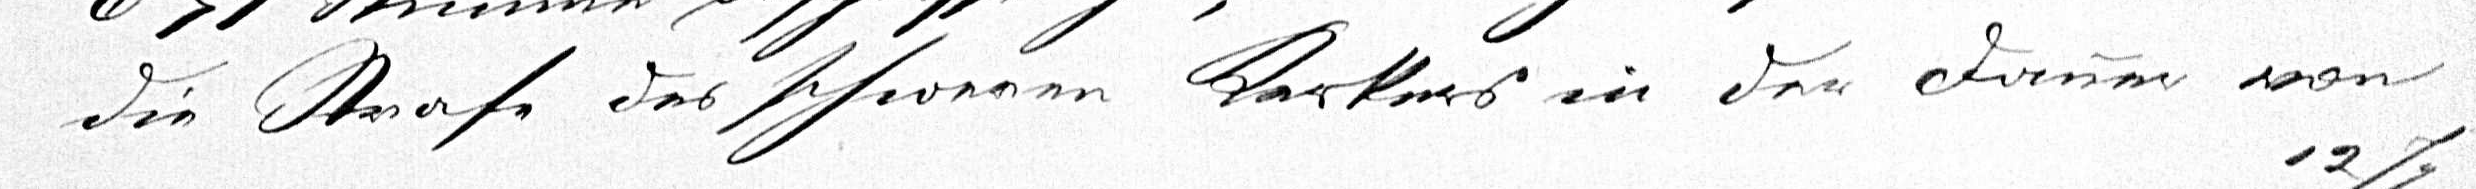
die Strafe des schweren Kerkers in der Dauer von
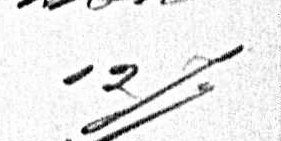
12J
